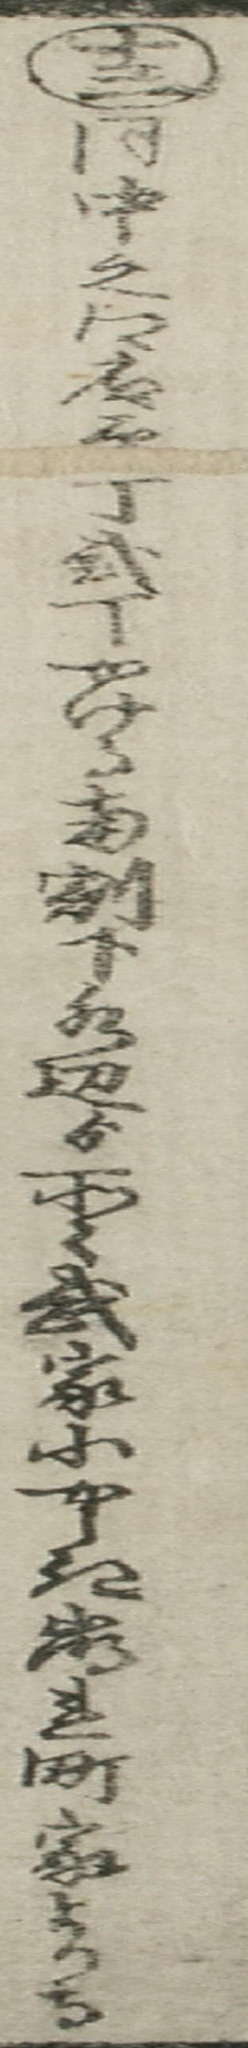同中之郷石原丁弐丁やける南割下水辺ゟ所々武家小やしき崩れ町家より寺
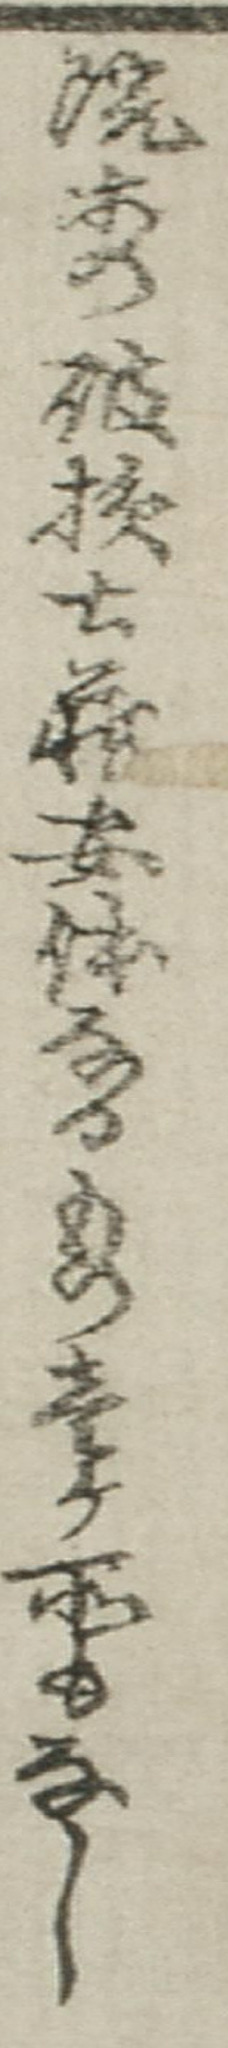院等の破損土蔵安体なるもの壱ケ所もなし
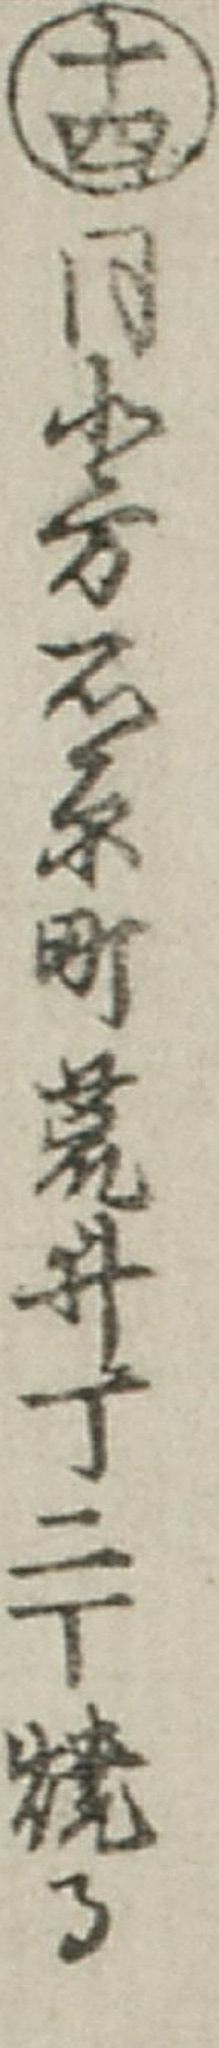同北方石原町荒井丁二丁焼る
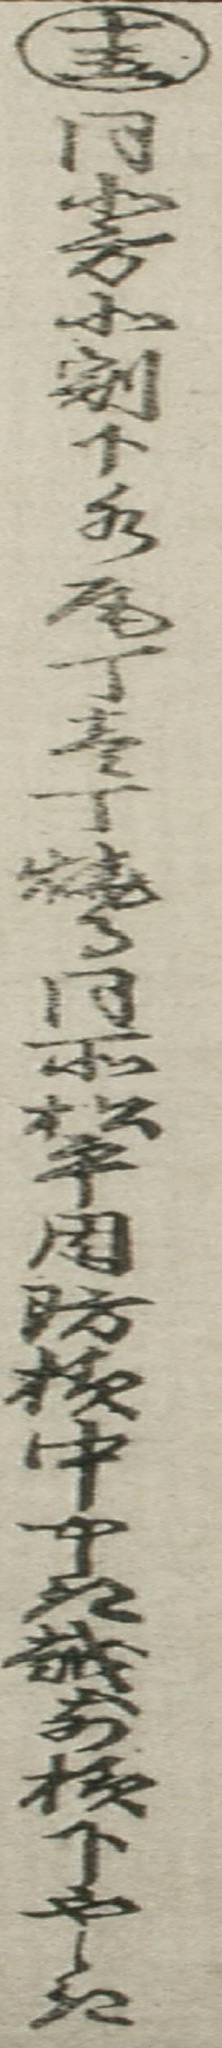同北方北割下水瓦丁壱丁焼る同所松平周防様中やしき越前様下やしき
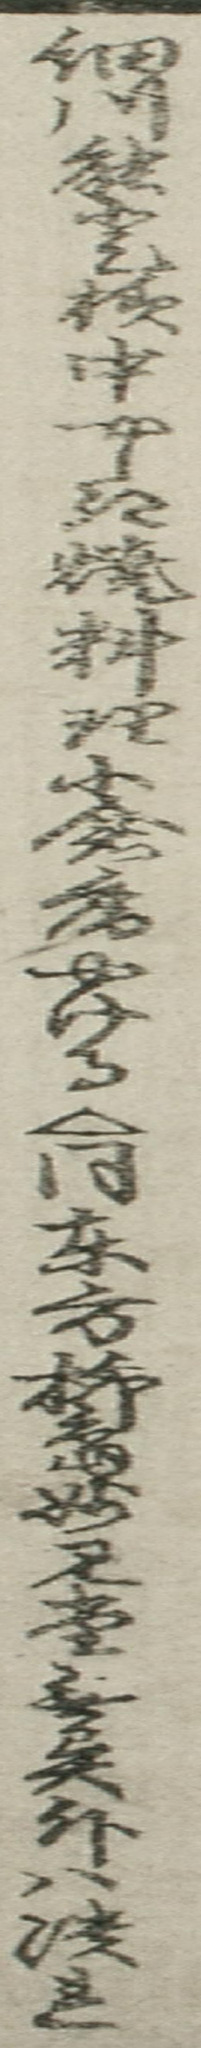細川能登様中やしき焼料理小倉房やける△同東方柳島妙見堂無異外は潰れ
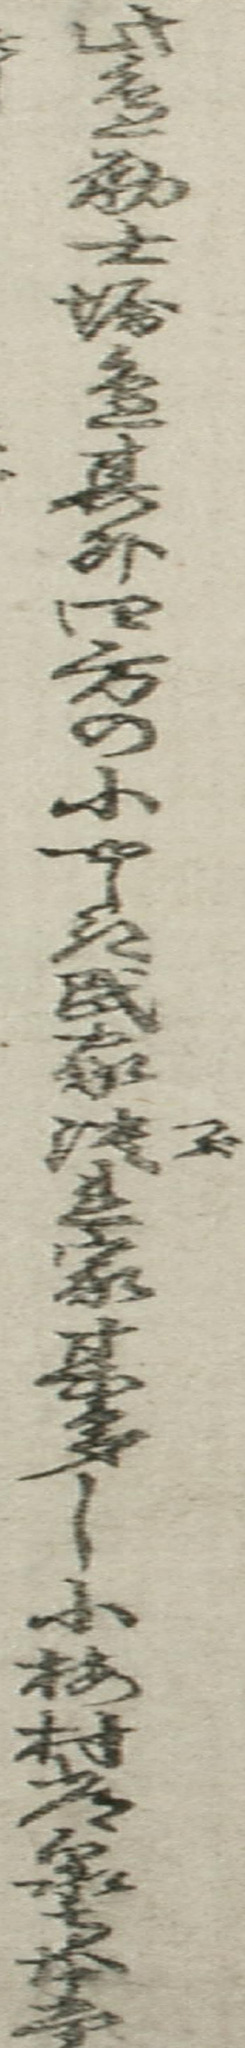此辺勤士堀辺其外四方の小やしき民家潰つぶれ家甚多し小梅村常泉寺本堂
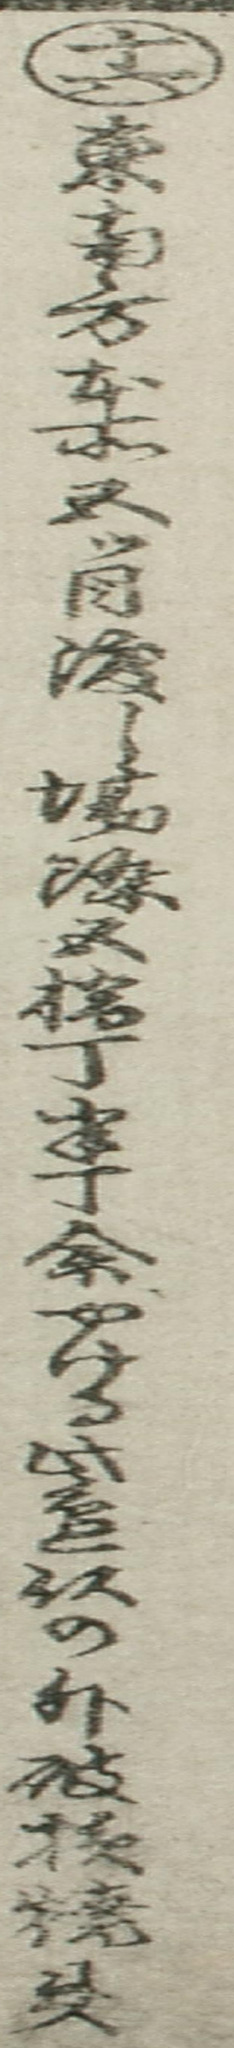東南方本所五ツ目渡し場際五橋丁半丁余やける此辺以の外破損焼失
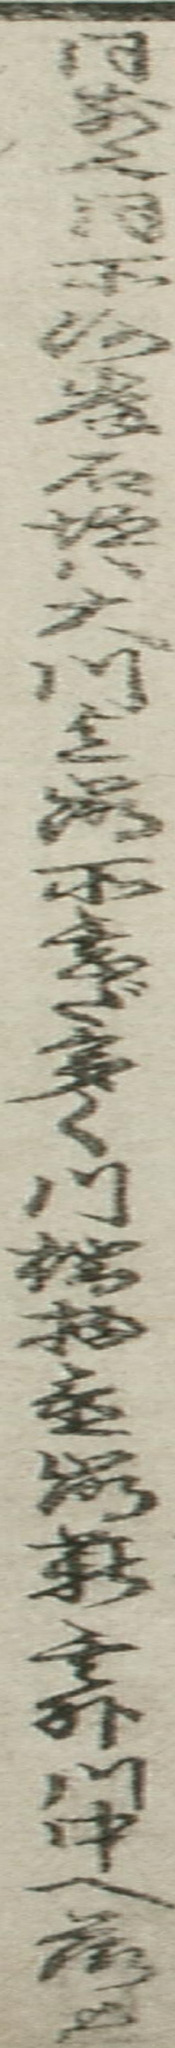同前也同所河岸石垣は大川迄崩所甚だ多く川端物置崩薪其外川中へ落込
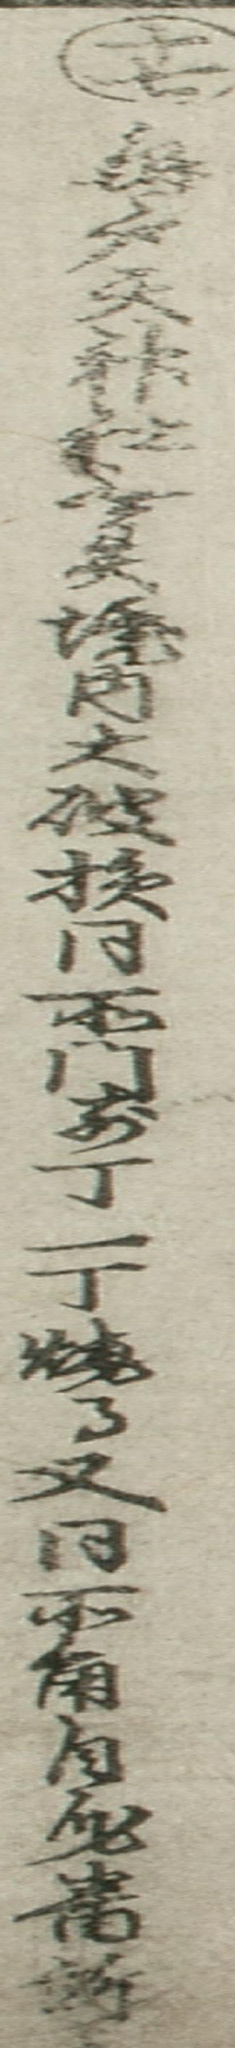亀戸天神社無異境内大破損同所門前丁一丁焼る又同所角自身番所より
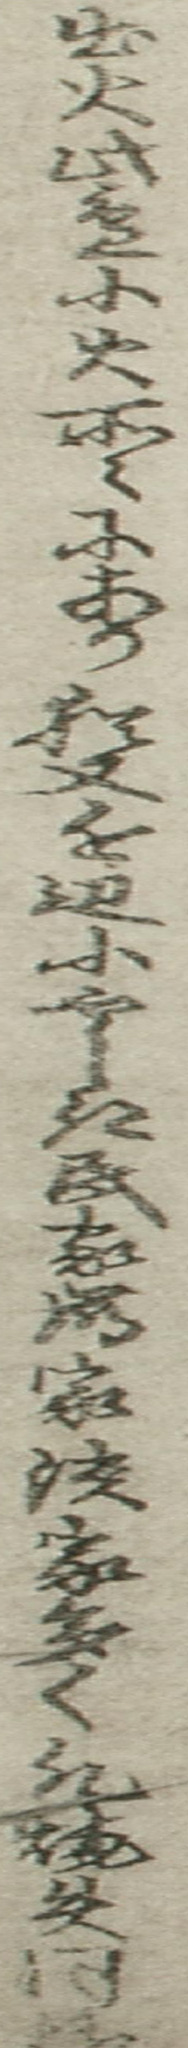出火此辺小火所々にあり猶又近辺小やしき民家崩家潰家多く凡焼失同様の所

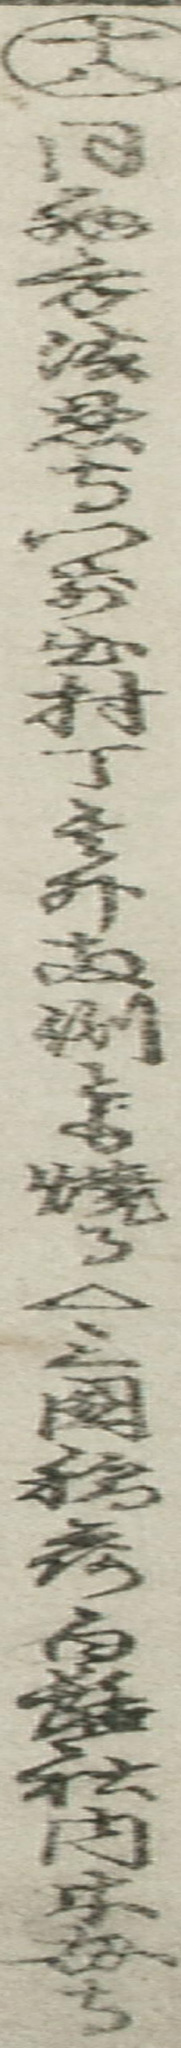同西方法恩寺御前出村丁其外両側とも焼る△三囲橋落白幡社内木母寺
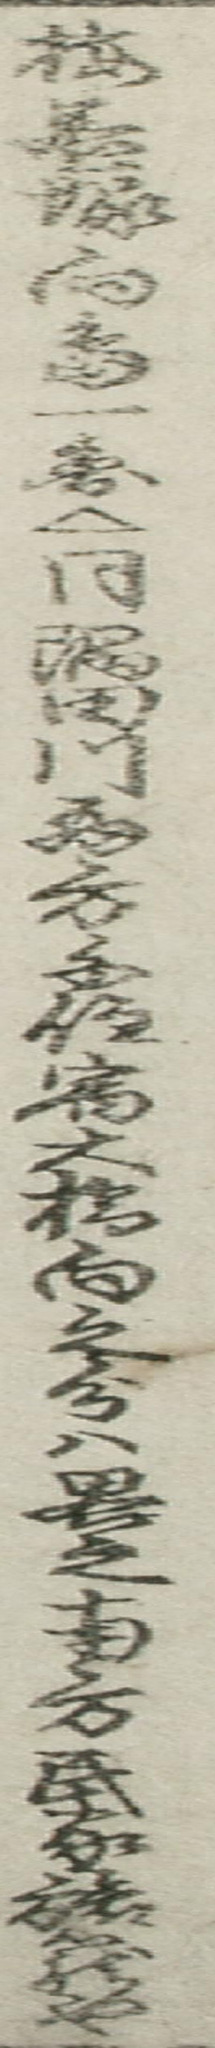梅若塚向島一圓△同隅田川西方千住宿大橋向之分は略之南方民家旅籠也
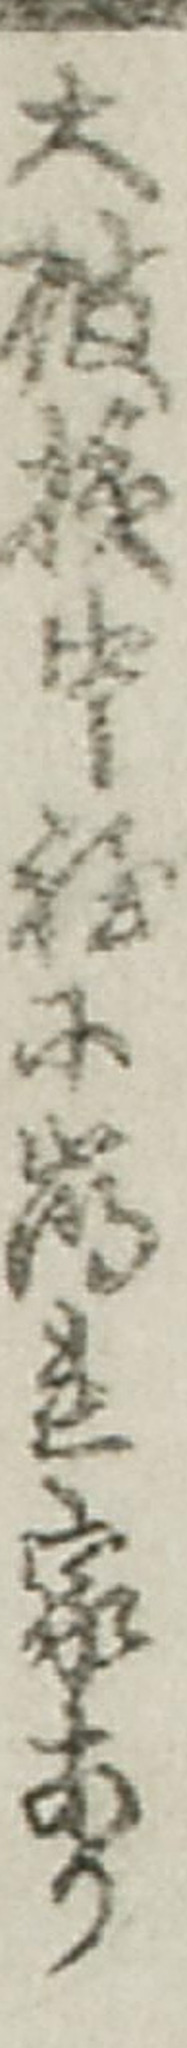大破損中程に崩れ家あり
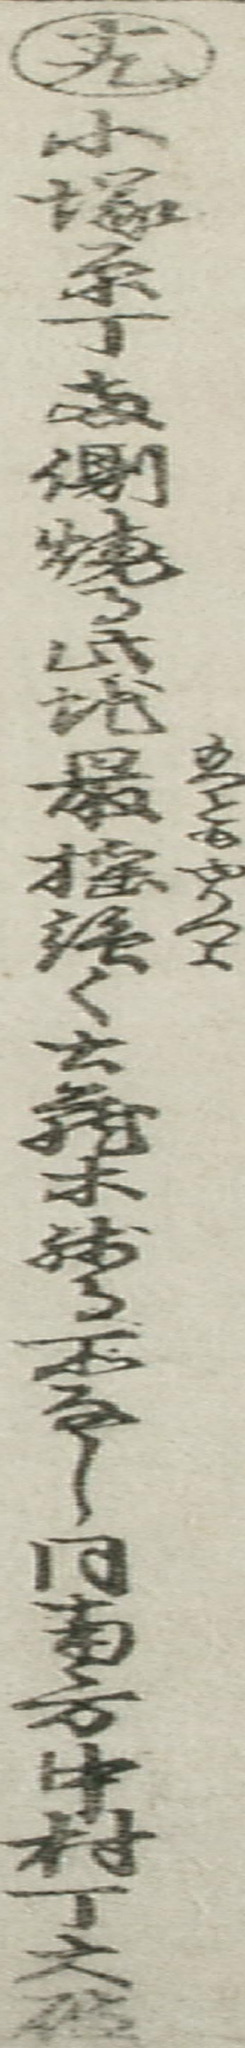小塚原丁南側焼る此地最揺強く土蔵等残る所なし同南方中村丁大破
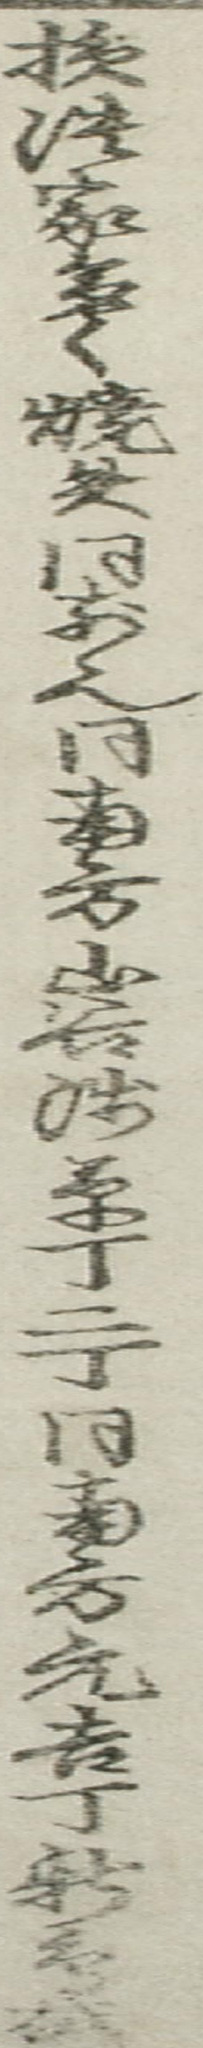損潰家多く焼失同前也同南方山谷浅原丁二丁目南方元吉丁新鳥越丁
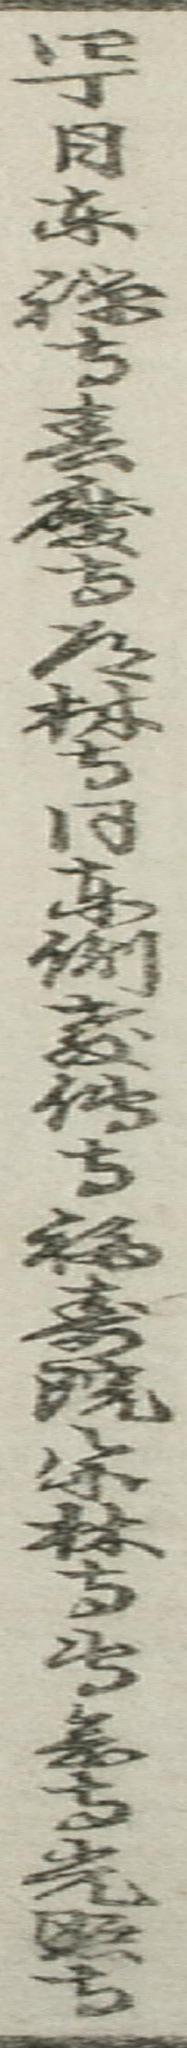四丁目東禅寺春慶寺道林寺同東側教傳寺福壽院宗林寺専念寺光照寺
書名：安政見聞誌　上
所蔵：東京大学地震研究所図書室 Earthquake Research Institute Library, The University of Tokyo, JAPAN
